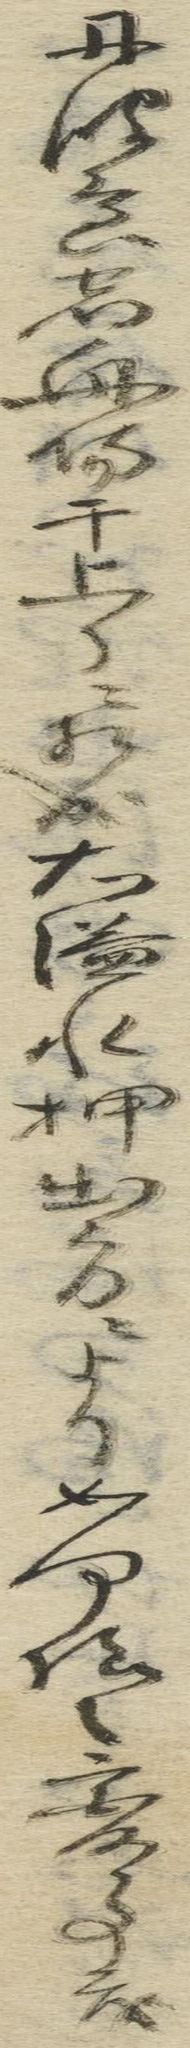丹波嶋宿舟場干上り二相成右溢水押出方二より如何様之変事も
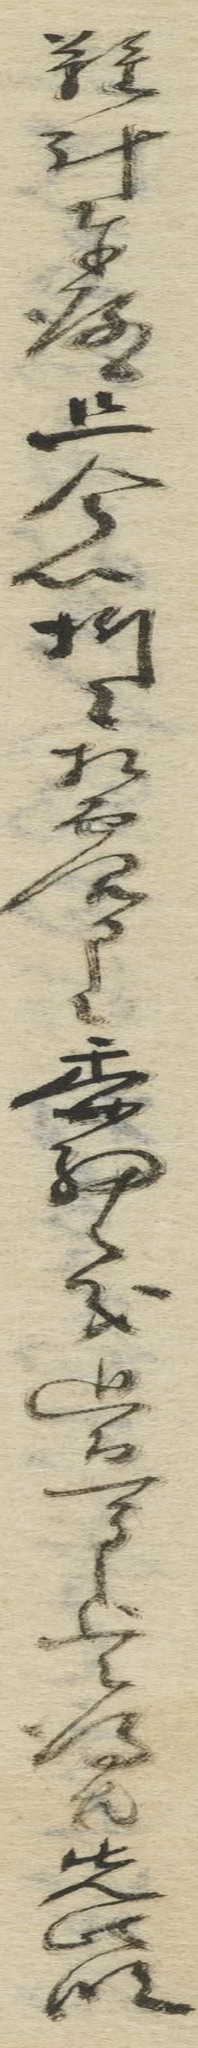難計奉存候且今以折々相震申候委細之義追而可申上候得共先此段
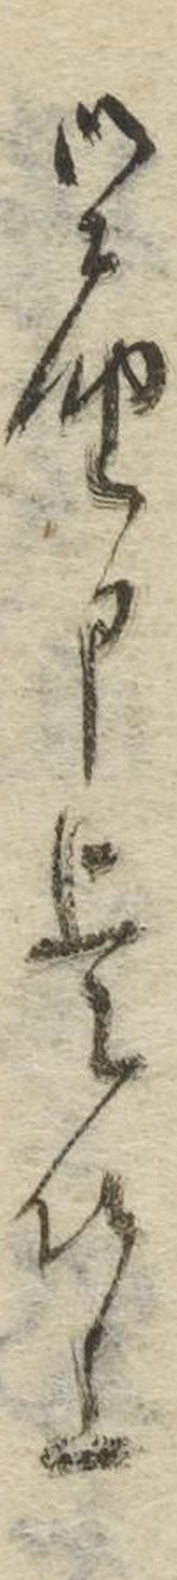御届申上候以上
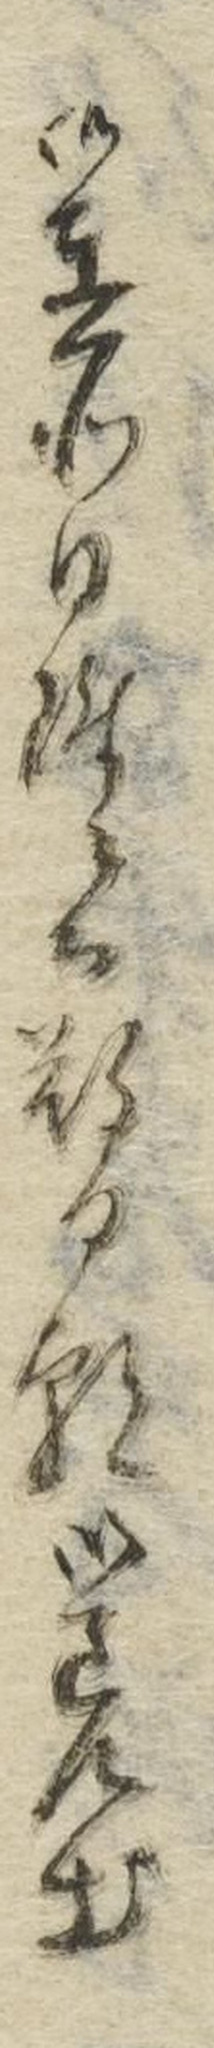御在所日附二而朔日朝御差出
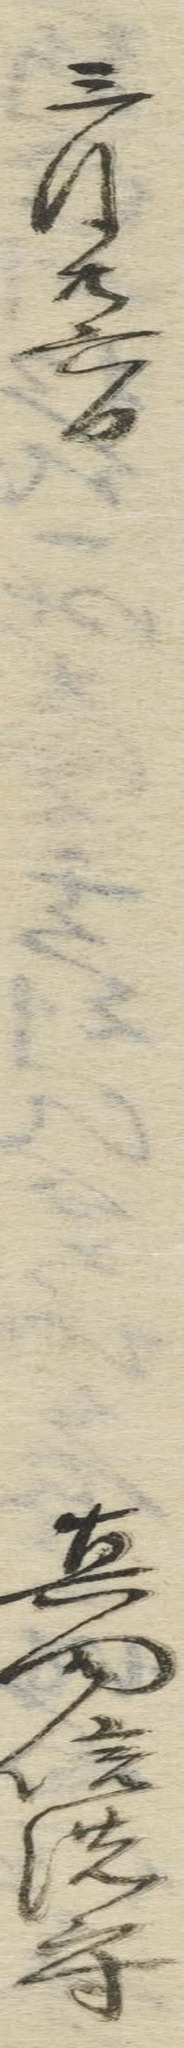三月廿六日真田信濃守
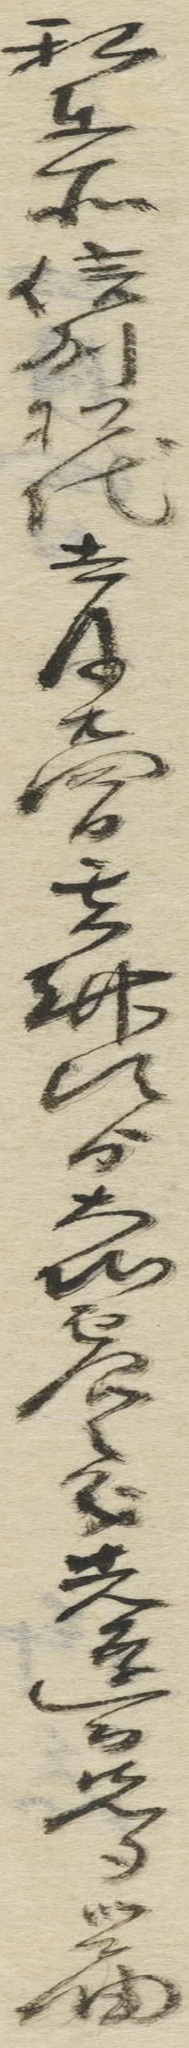私在所信州松代去月廿四日夜亥刻頃ゟ大地震之儀先達而先ッ御届
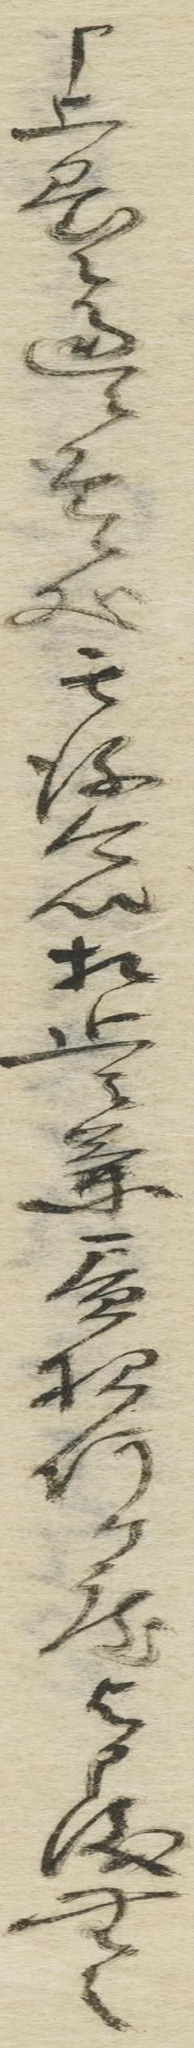申上置候通二御座候処其後今以相止ミ兼昼夜何ヶ度と申儀無之
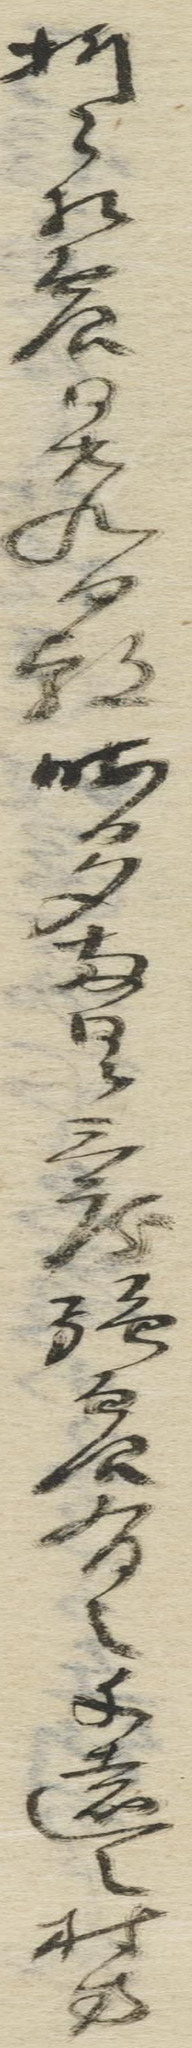折々相震同廿九日朝晦日夕両日ニ三度強震有之手遠之村方
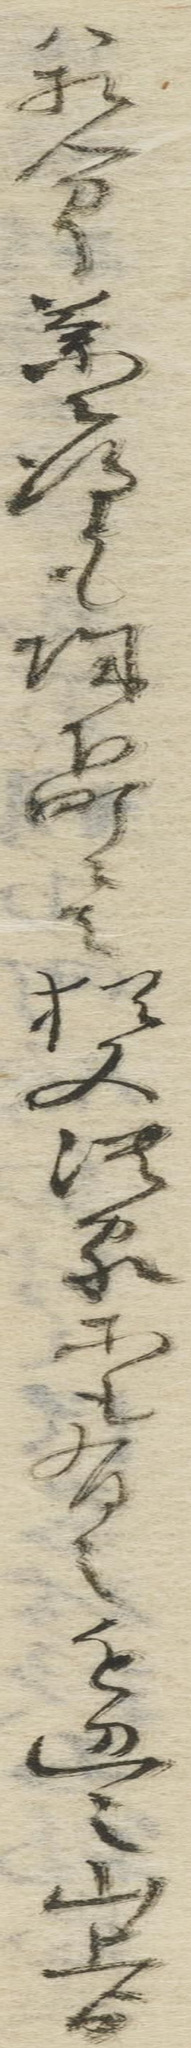ハ相分兼候得とも城下町二は猶又潰家等も有之近辺之山上ゟ
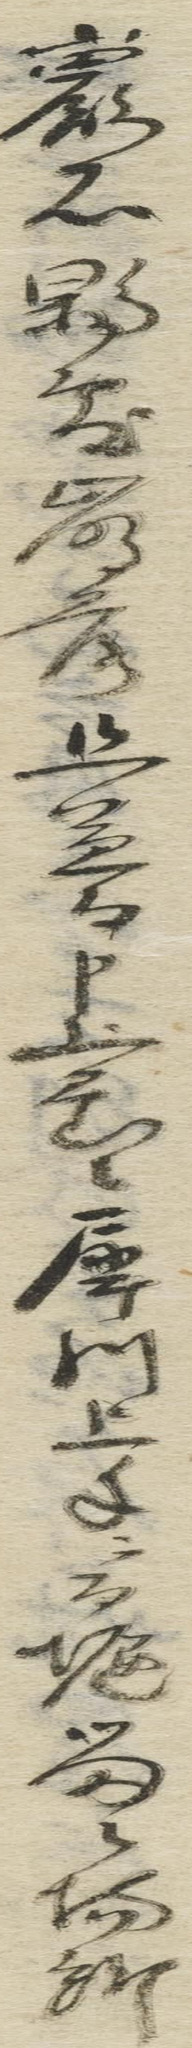巌石夥敷崩落且兼而申上置候犀川上手二而堰留候場所
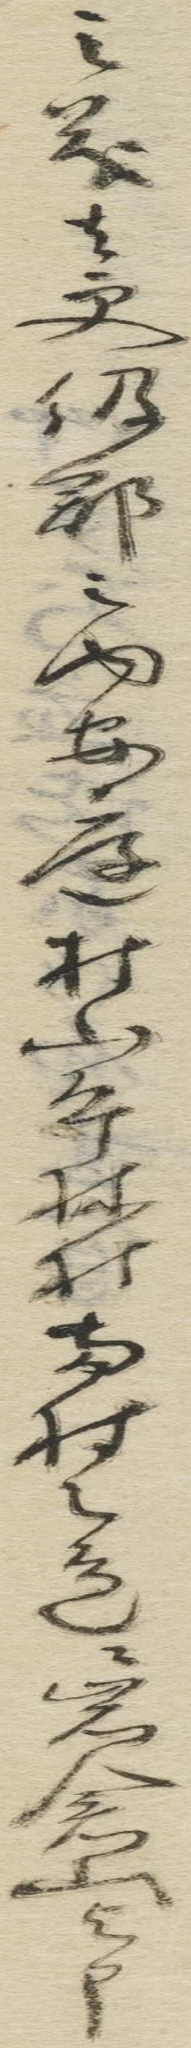之義は更級郡之内安庭村山平林村両村之辺二岩倉と申
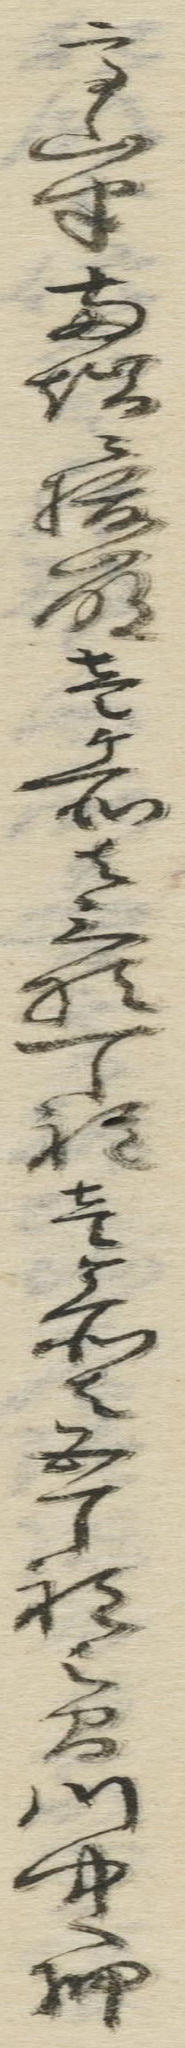高山半両端二抜崩壱ヶ所は三拾丁程壱ヶ所は五丁程之間川中江押
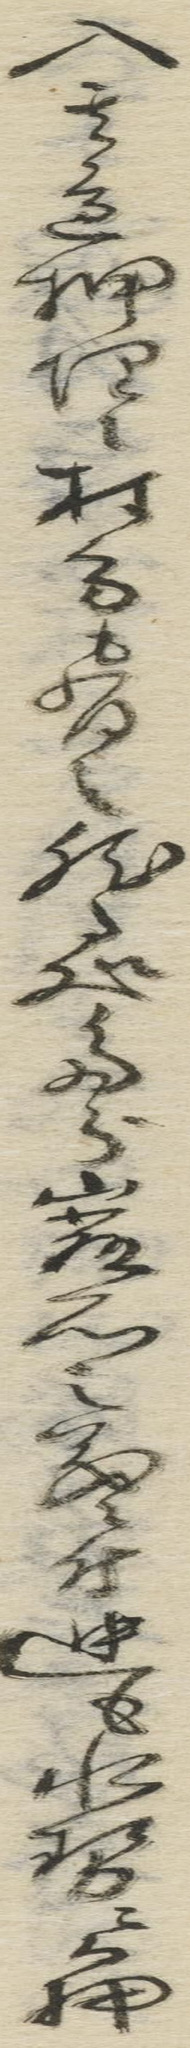入其辺押埋候村方も有之然ㇽ所多分巌石之義二付迚も水勢二而押
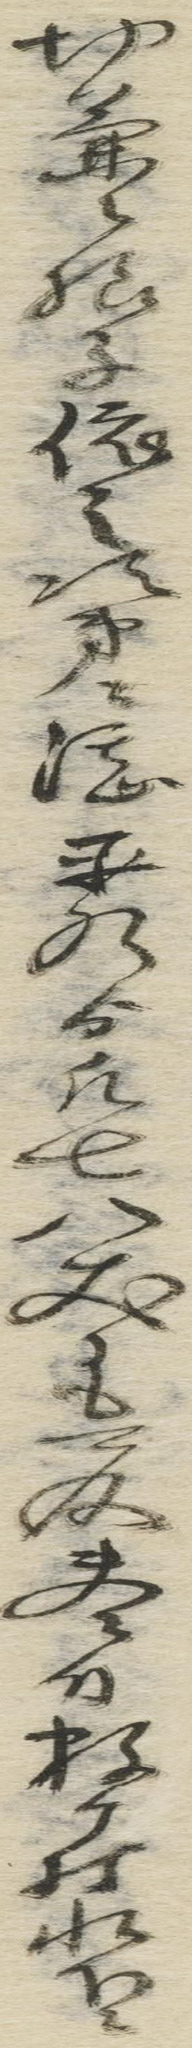切兼候様子依之次第二湛平水ゟ凡七八丈にも可及夫二付数ヶ村水下二
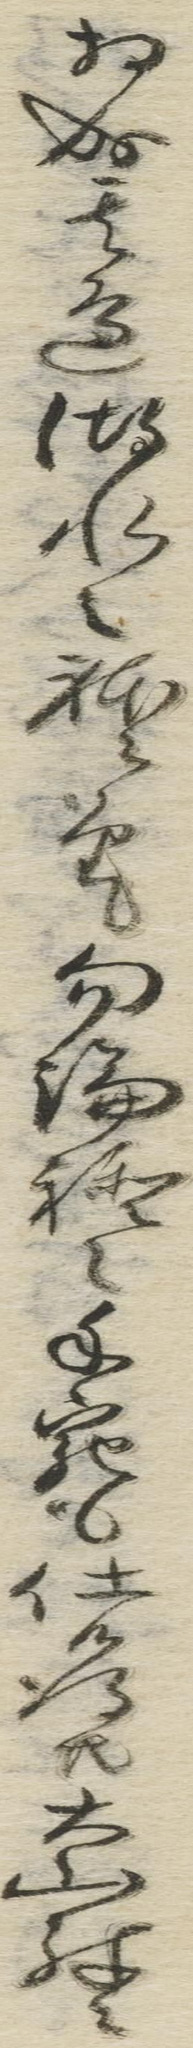相成其辺湖水之躰二御座候勿論種々手当宛も仕候得共大山殊二
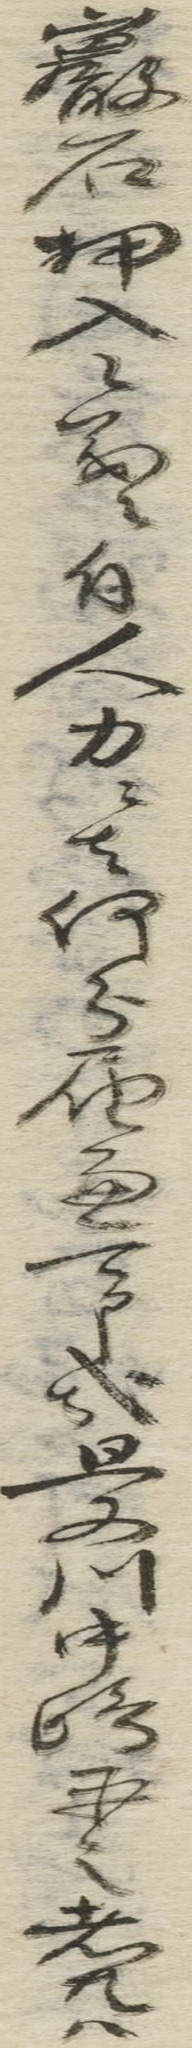巌石押入候義二付人力二は何分届兼可申哉且又川中嶋平之者共ハ
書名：弘化丁未天變日記
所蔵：東京大学地震研究所図書室 Earthquake Research Institute Library, The University of Tokyo, JAPAN
